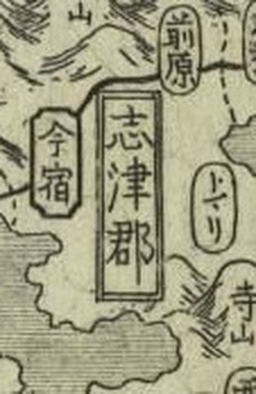志津郡
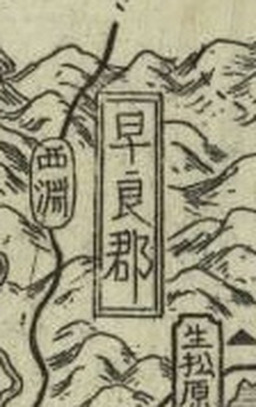早良郡
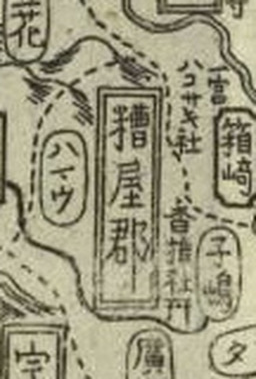糟屋郡
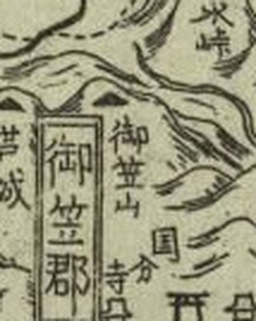御笠郡
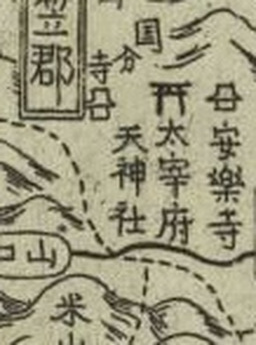天神社
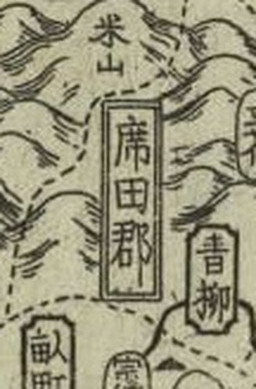席田郡
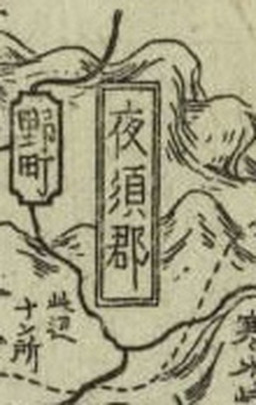夜須郡
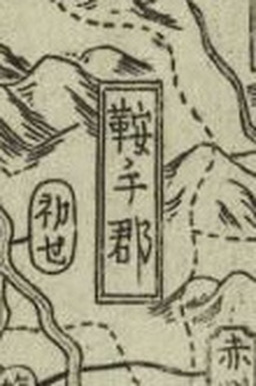鞍手郡
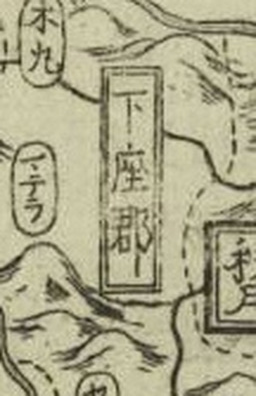下座郡
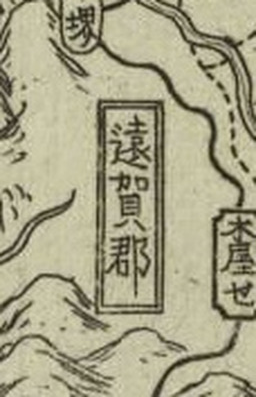遠賀郡
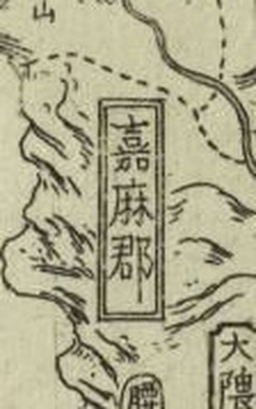嘉麻郡
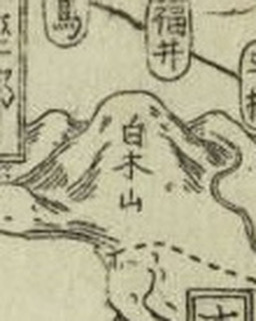白木山
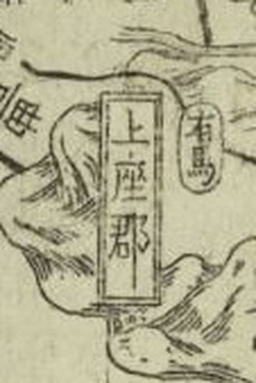下座郡

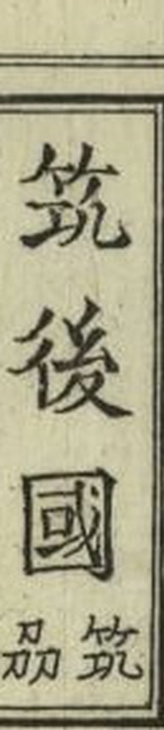筑後川
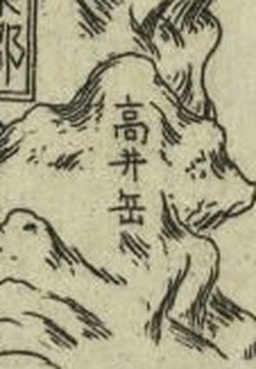高井岳
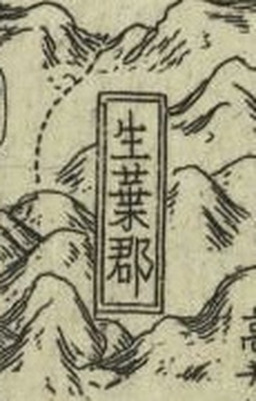生葉郡
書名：大日本国細図 西国之部 下
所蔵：University of the Ryukyus Library
